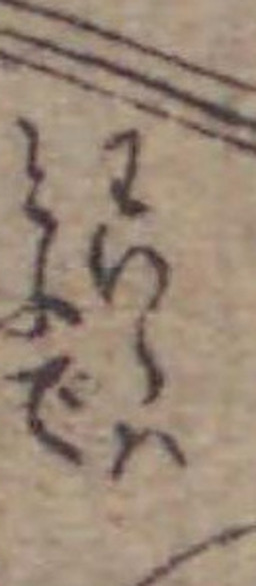とふで
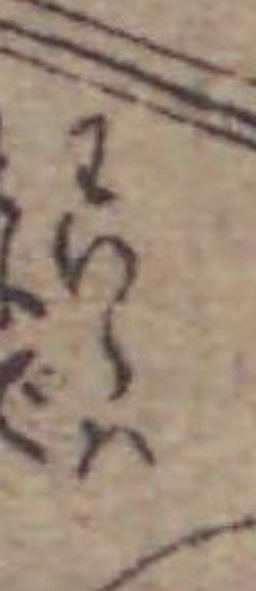わいらは
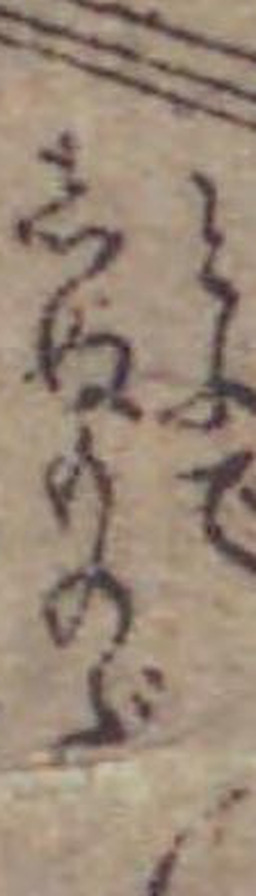しぬものだ
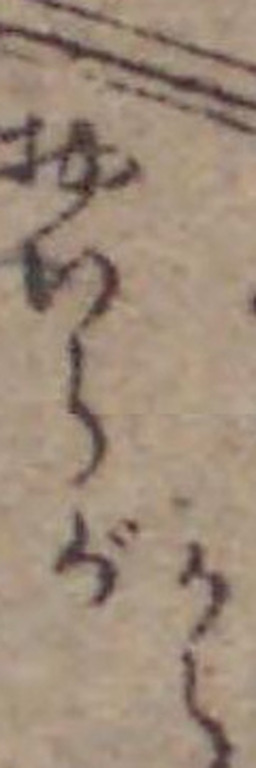おいらが
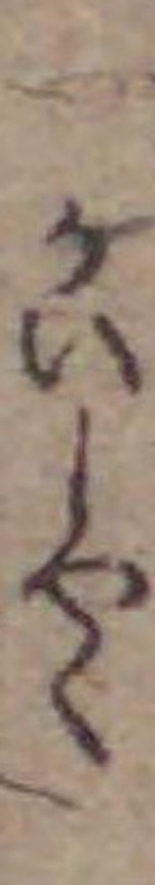かいしやく

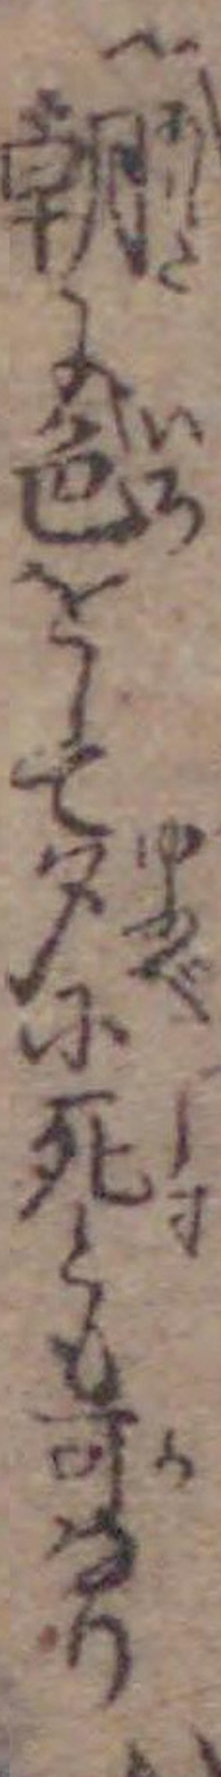〽朝に色をして夕に死とも可なり
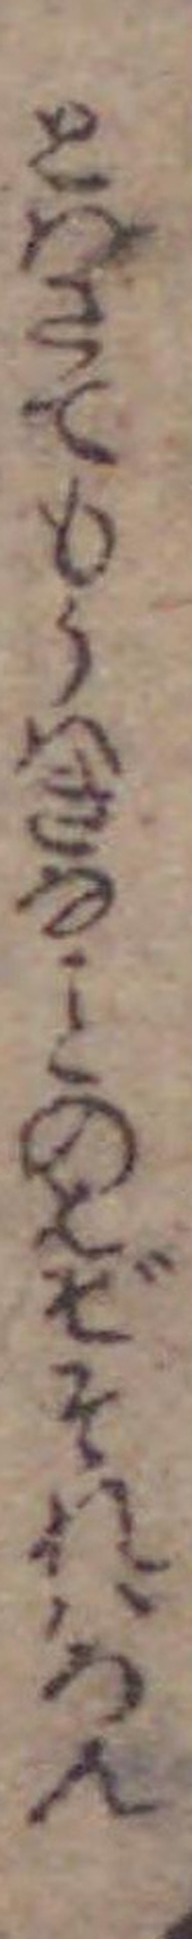とはさてもうはきなことのはぞそれはろん
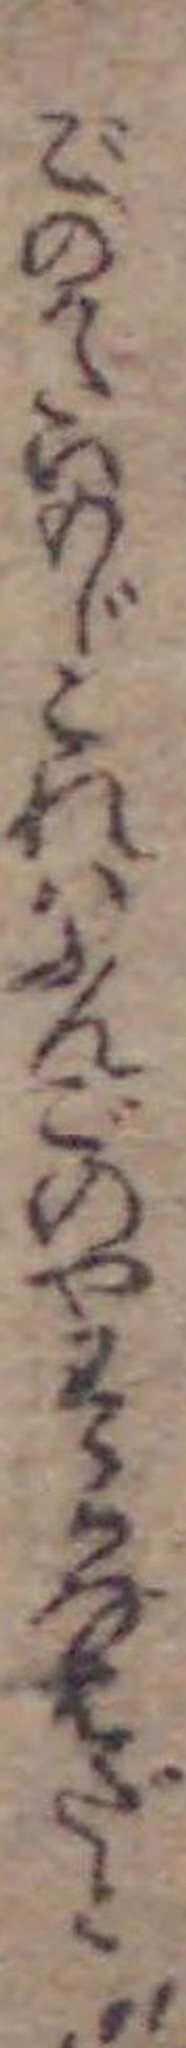ごのかたいもじこれはふんごのやわらかなはだと
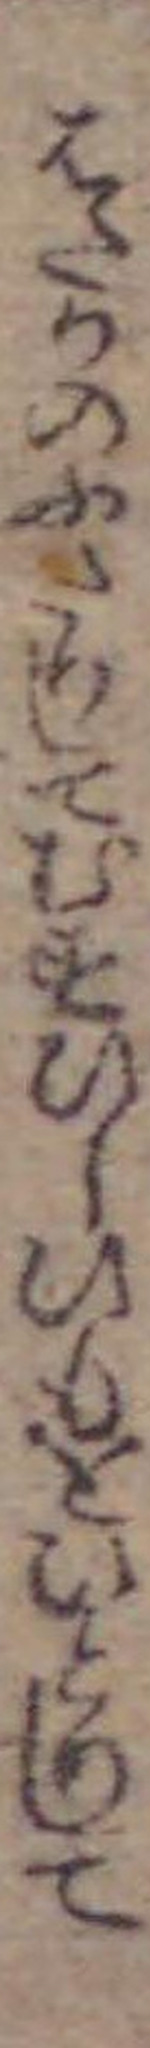はたかのふたりしてむすびしひもをひとりして
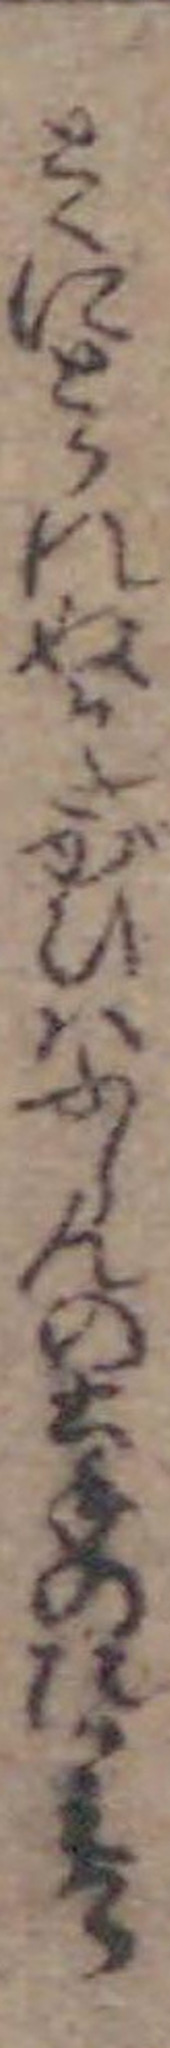とくにとかれぬうたがひはふしんの土手のたかみから
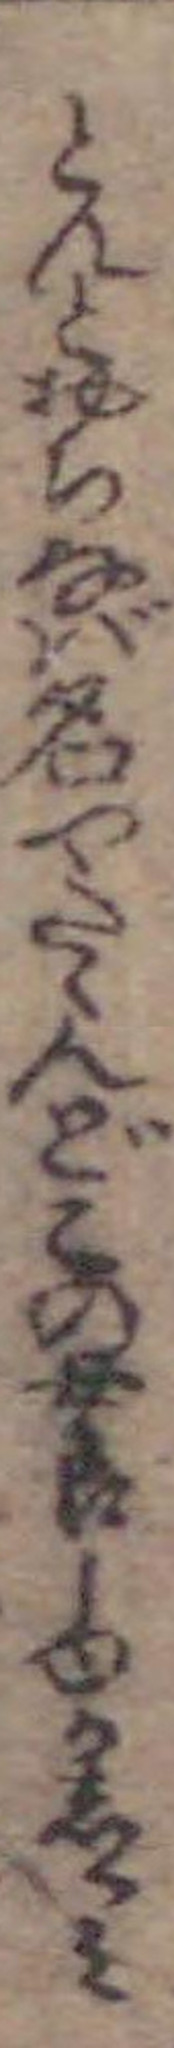とんとおちなば名やたゝんどこの女郎しゆかしらみ
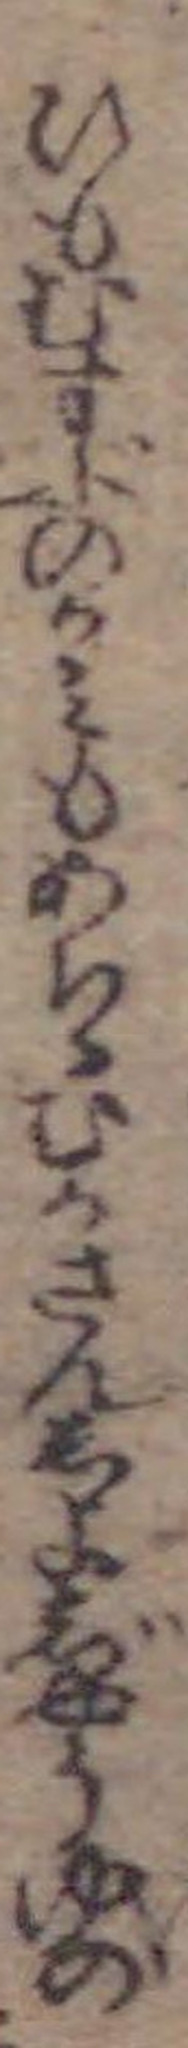ひもむすぶのかみもあちらむかさんしよじやうゆの
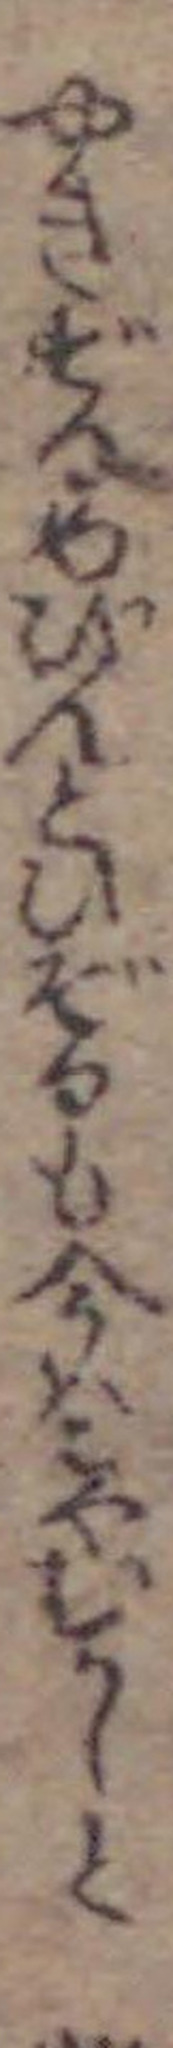やきずるめぴんとひぞるもいまははやむかしと
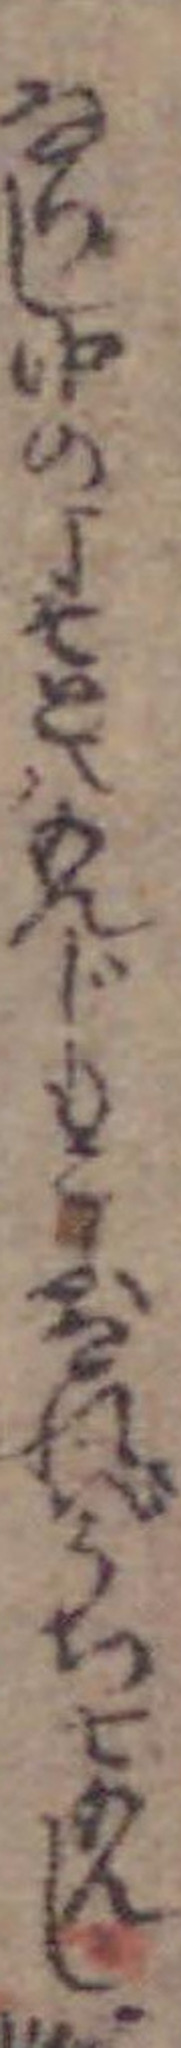なりし中の丁そと八もんじもこふなればうち七もんじに
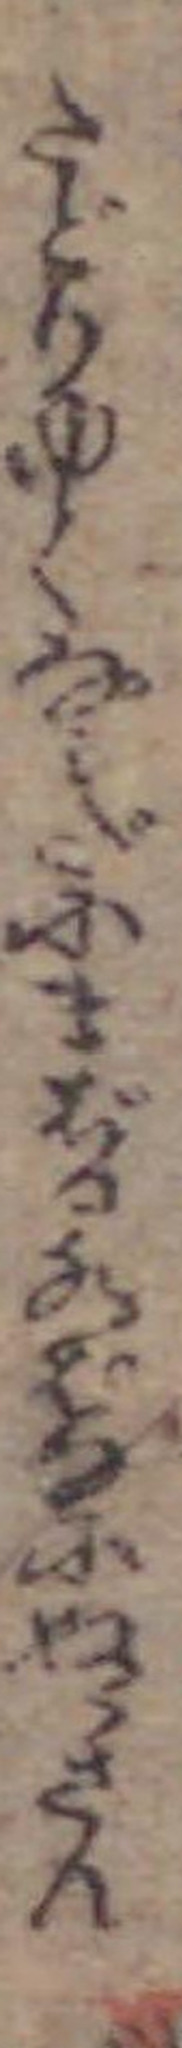たどりゆくなみだにまじる水ぱなにぬらさん
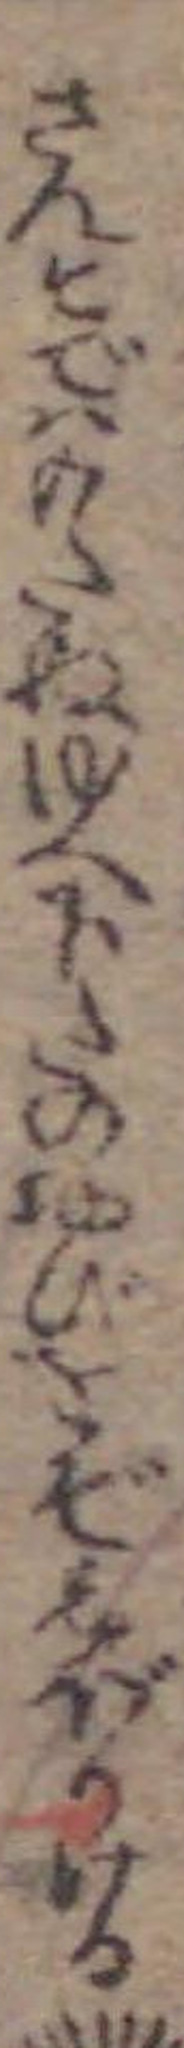さんそではもたぬゆへ下たのおびをぞしぼりける
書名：江戸生艶気樺焼 : 3巻
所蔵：国立国会図書館 National Diet Library, JAPAN
